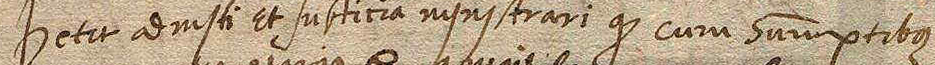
Petit admjti Et Justicia mjnjstrari ꝙ cum sūmptibꝯ
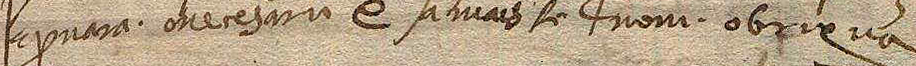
E ꝓuara . o necesario e a mais se nom . obrigua
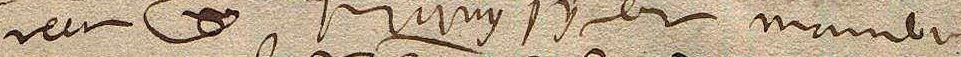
elle s̄or Jmquysydor mandou
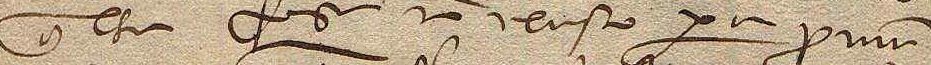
q̄ lhe fose c̄ocluso ꝑa ꝓnū
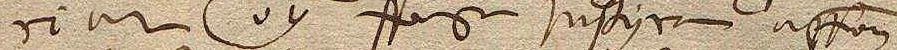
ciar o q̄ ffose Justyça af̄fom
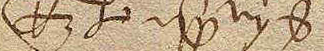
R̄z ho esp̄vy
